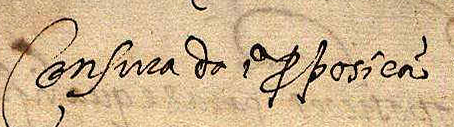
Censura da 1a ꝓposiçaõ
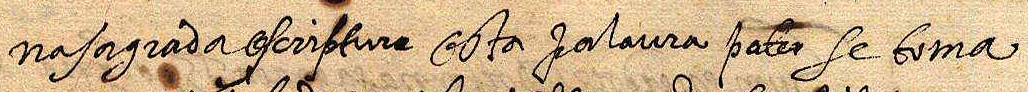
na sagrada escriptura esta palaura pater se toma
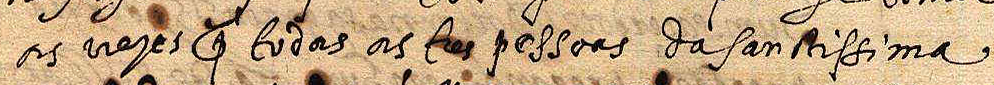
as uezes p̄o todas as tres pessoas da sanctissima
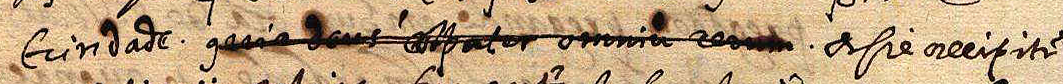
trindade. quia deus est pater omniū rerum. & sic accipitr̄
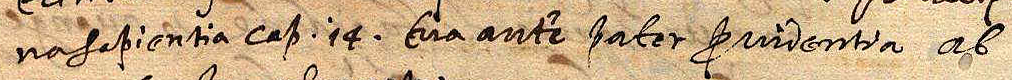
na Sapientia cap. i4. tua autē pater ꝓuidentia ab
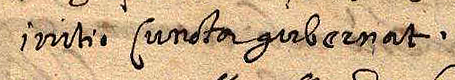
initio Cuncta gubernat.
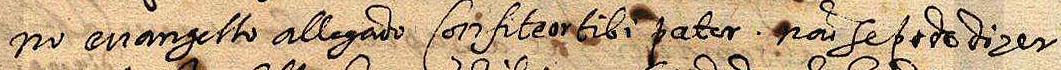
no euangelho allegado Confiteor tibi pater. naõ se pode dizer
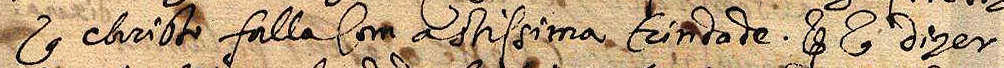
q̄ christo falla Com a s̄tissima trindade. p̄oq̄ dizer
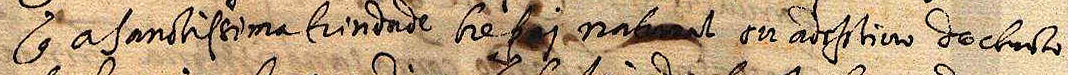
q̄ a sanctissima trindade he paj natural ou adoptiuo de christo
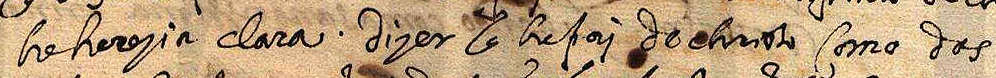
he herezia clara. dizer q̄ he paj de christo Como das
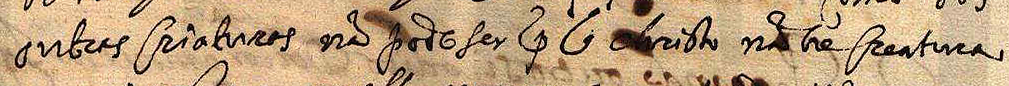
outras Criaturas naõ pode ser p̄oq̄ christo naõ he Creatura
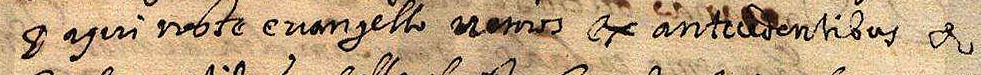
E aqui neste euangelho uemos ex antecedentibus &
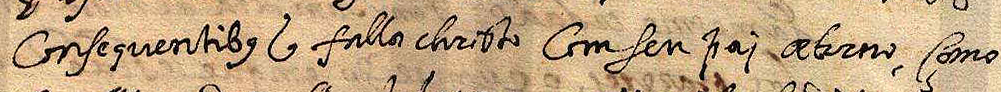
Consequentibꝯ q̄ falla christo Com seu paj æterno, Como
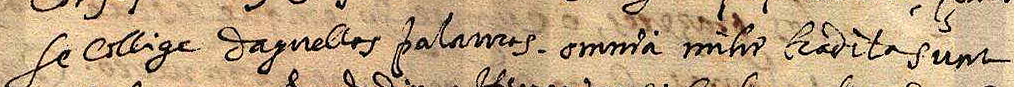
se collige daquellas palauras. omnia mihi tradita sunt
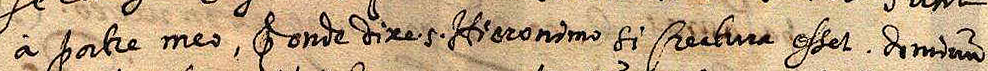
a patre meo, p̄o onde dixe s. Hieronimo si Creatura esset dominū
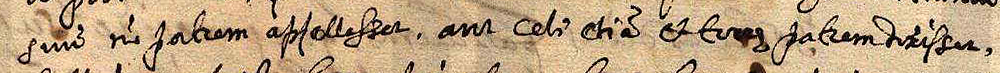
suū nō patrem appellasset, aut celi etiā & terræ patrem dixisset,
